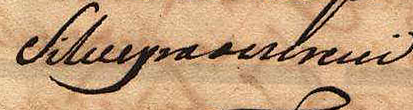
Silueyra o escreui
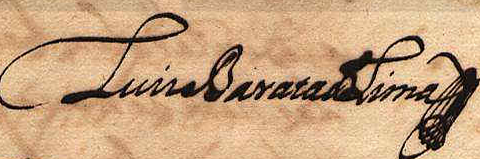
Luiz Barata d̄ Lima
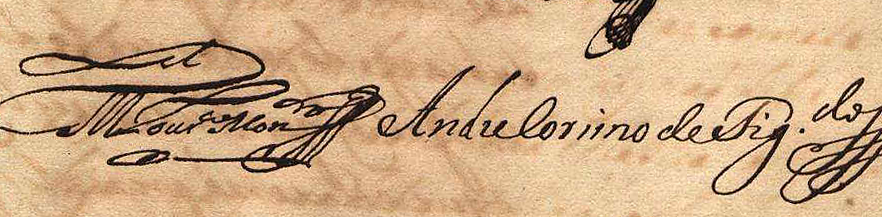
Mel Lourco Andre Corsino de Fig.do
